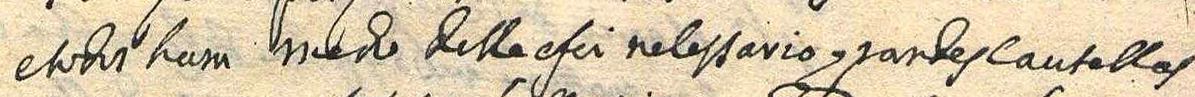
e todos ham medo delle e foi necessario grandes cautellas
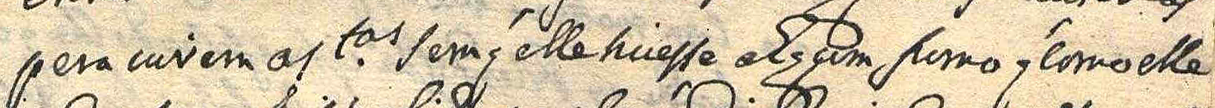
pera uirem as t.as sem q̄ elle tiuesse algum servo q̄ como elle
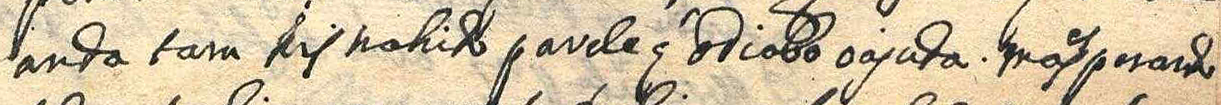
anda tam distrahido parece q̄ o diabo o ajuda. mas esperando
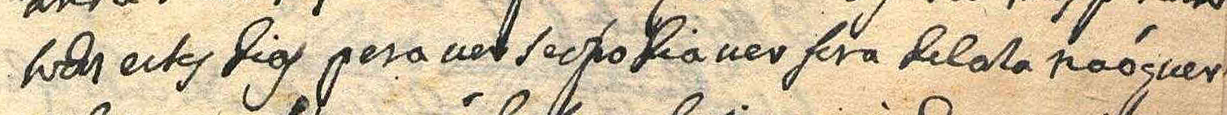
todos estes dias pera uer se o podia uer fora de Caza naõ quer
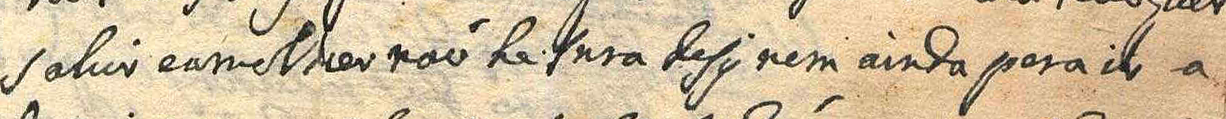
sahir e a molher naõ he snra de sy nem ainda para ir a
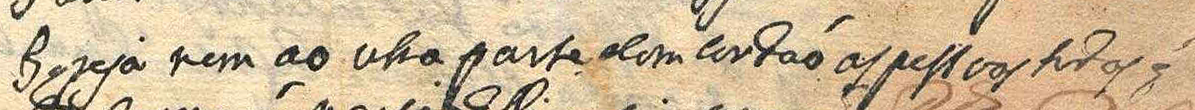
Igreja nem a outra parte a comcordaõ as pessoas todas q̄
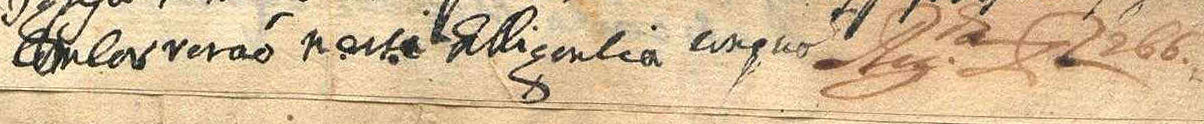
comcorreraõ nesta dilligencia con que Reg.da fL 266
